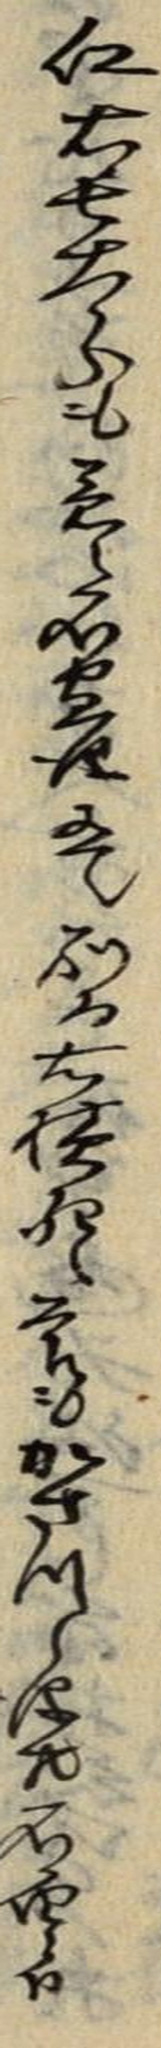但右長太郎も兼々不宜儀有之別て右横死之節もかさつ之儀共不届に付
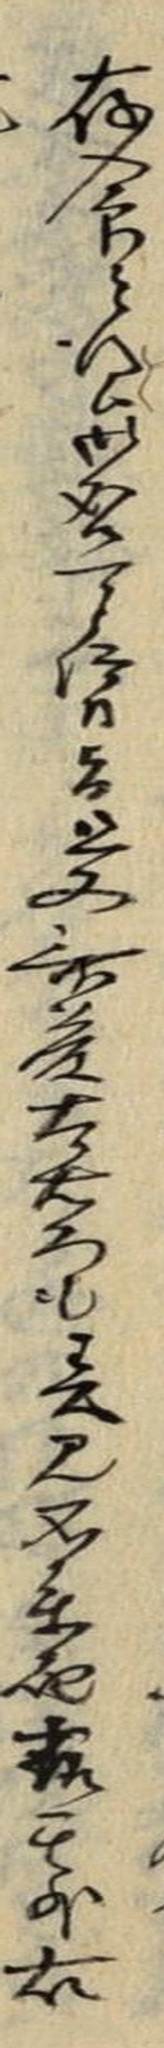存命に候得は御咎可被仰付旨且又齋藤太右衛門も異見不参届其外右
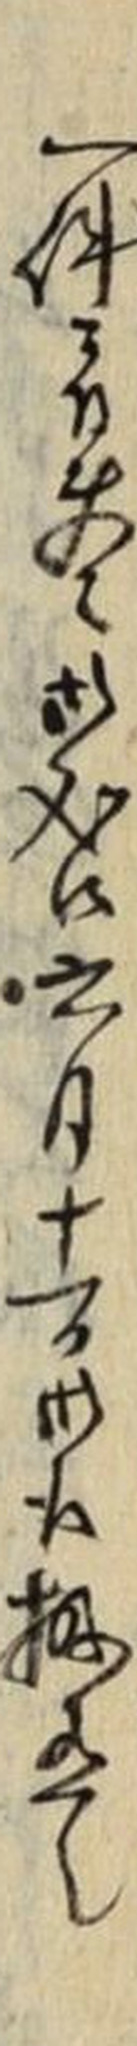一件に付夫々御咎六月十一日御取扱有之
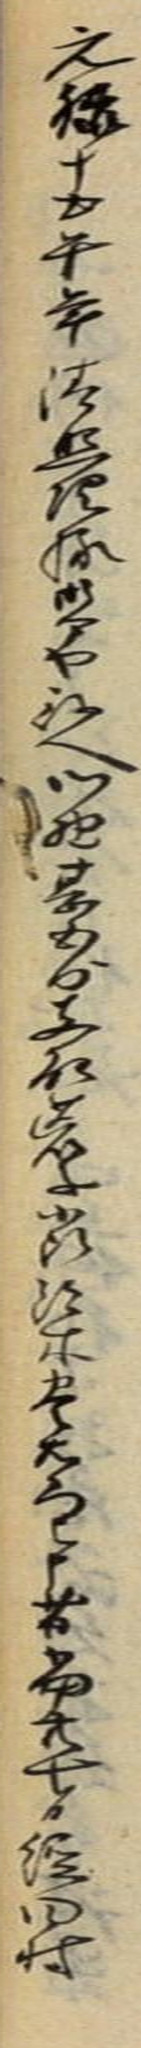一元禄十五午年清照院様御部や役人門野甚五右衛門支配荒子小頭鈴木豊右衛門と申者当廿七日経田村
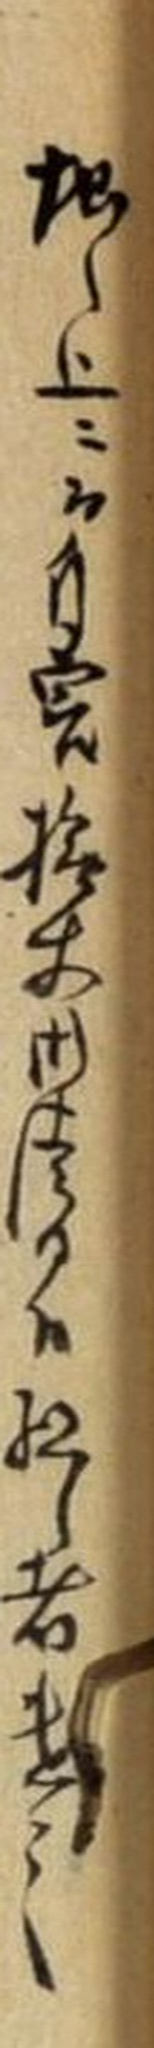地之上にて自害検使御徒目付組之者遣之
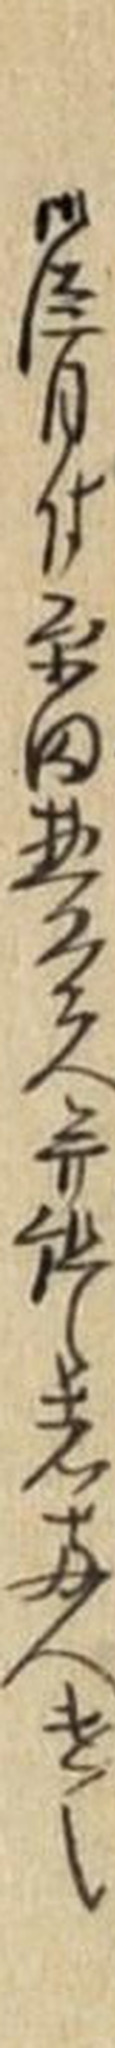御徒目付原田惣大夫并組之者両人遣之

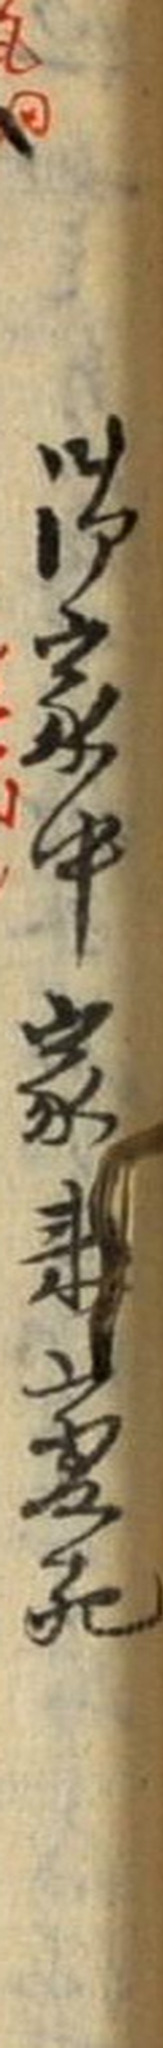御家中家来変死
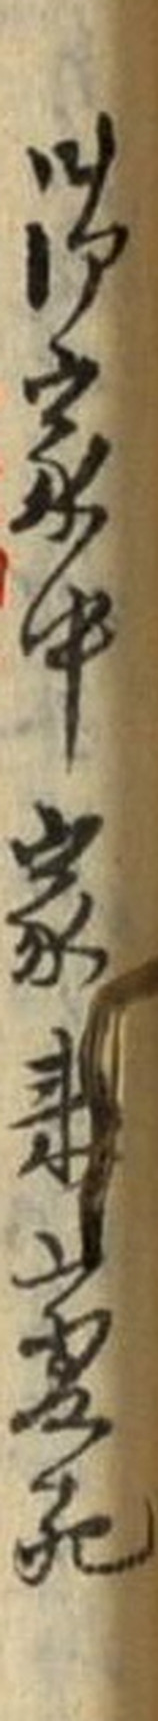御家中家来変死
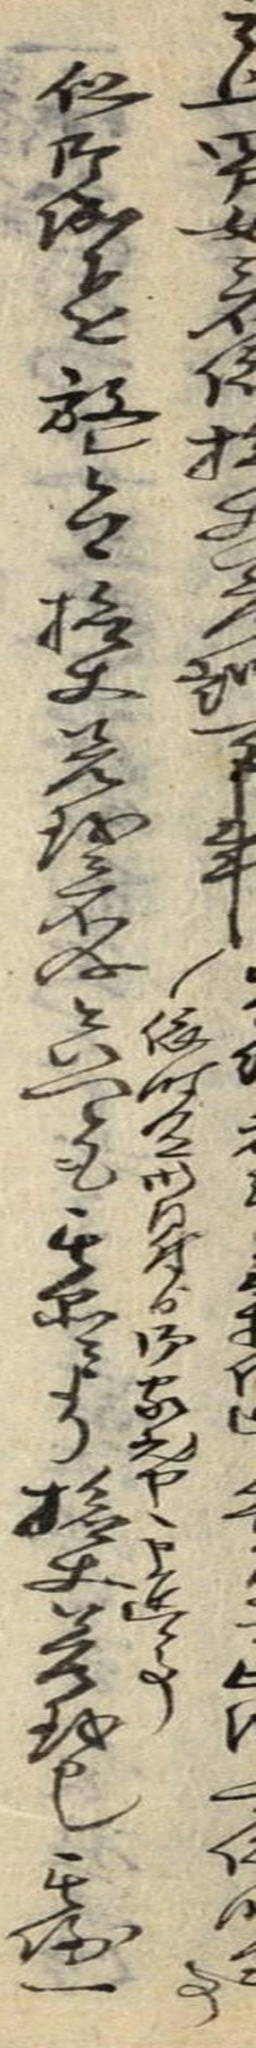但御城下を放レ候はゝ検使差越に不及といへとも其品により検使差越申候其例一
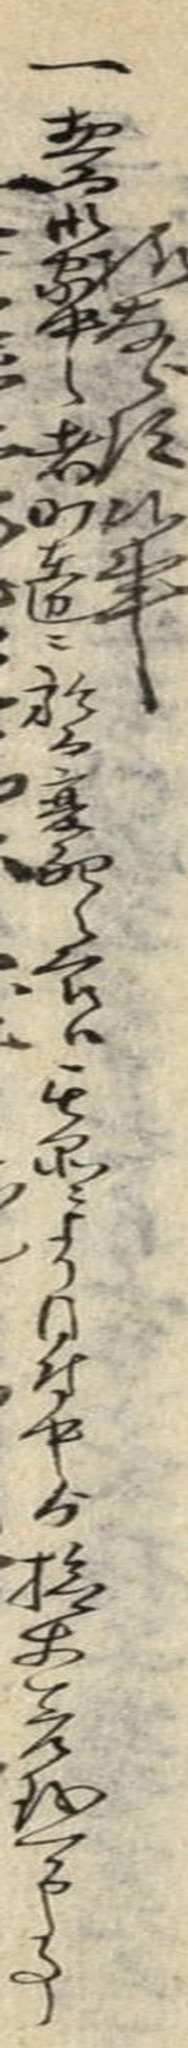一惣て御家中之者町在辺に於て変死之節は其品により目付中ゟ検使差越可申事
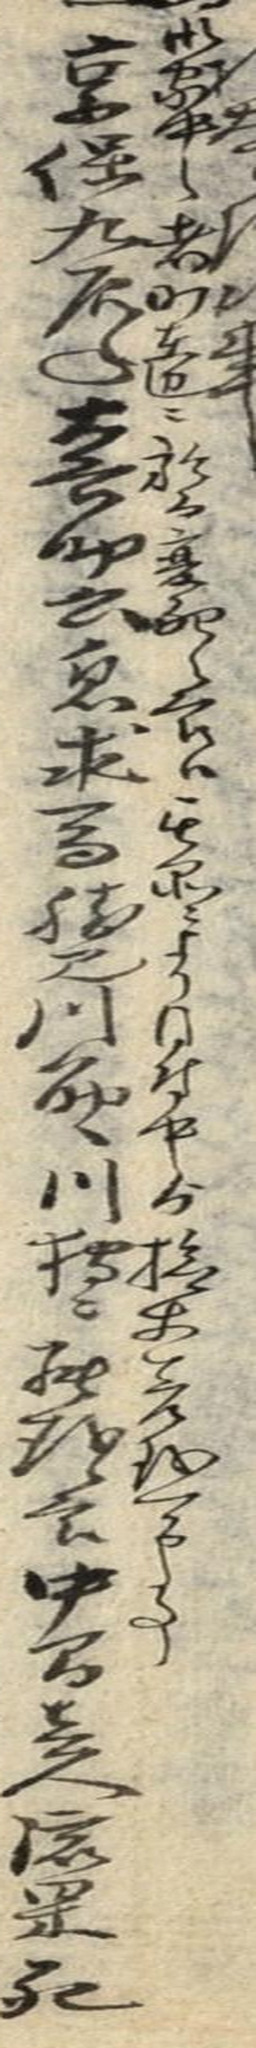一享保九辰年大谷助六息求馬勝見川筋へ川狩に罷越候節中間壱人流果死
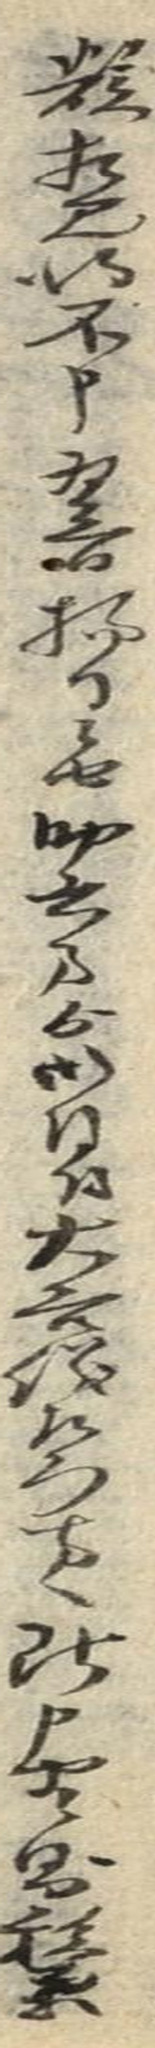骸相見得不申翌日揚り候由助六方ゟ御目付大谷儀左衛門方へ断申聞候則稲葉
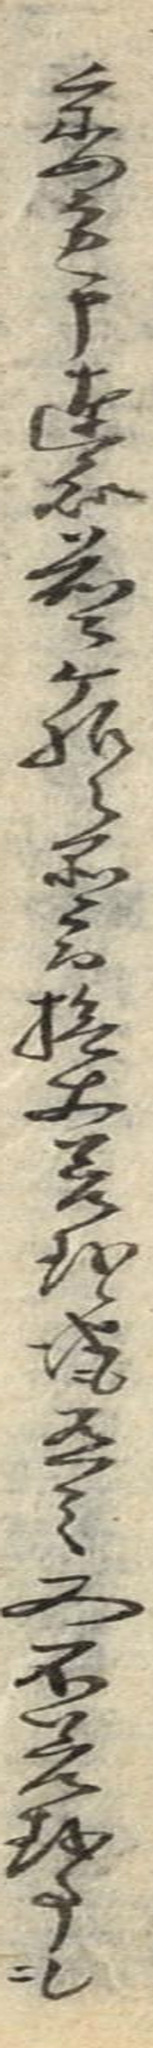采女方へ申達候処前々ケ様之品にて検使差越候儀も有之又不差越事も
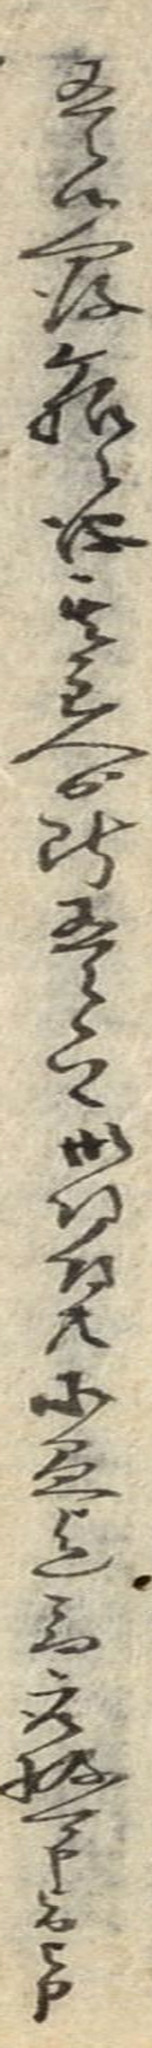有之候向後ケ様の儀其主人ゟ断有之候はゝ御目付共承置迄にて取扱可申旨被申
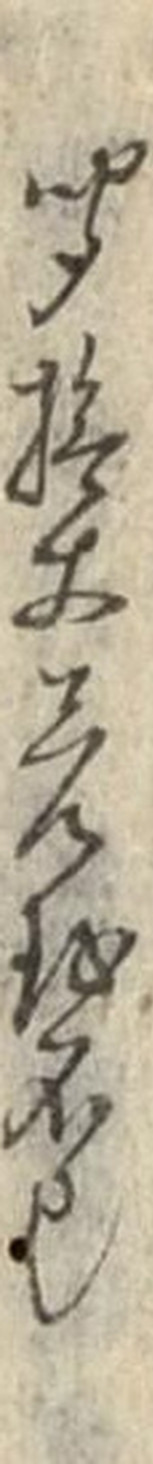聞検使差越不申也
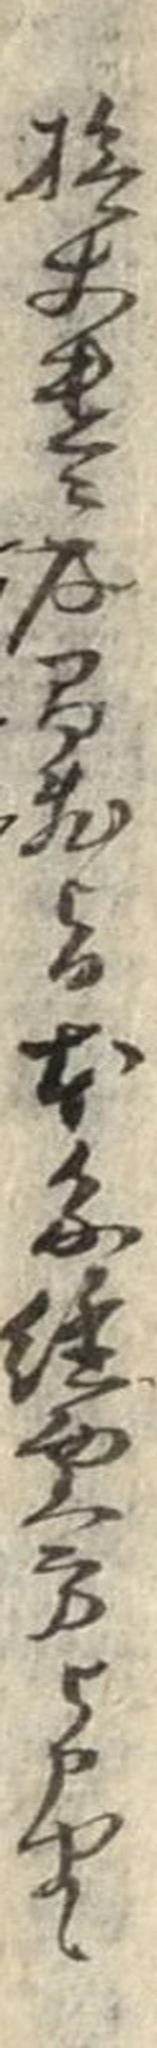検使遣に及間敷旨本多縫殿方被申聞候
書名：御停止異変死失
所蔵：福井県文書館 Fukui Prefectural Archives
